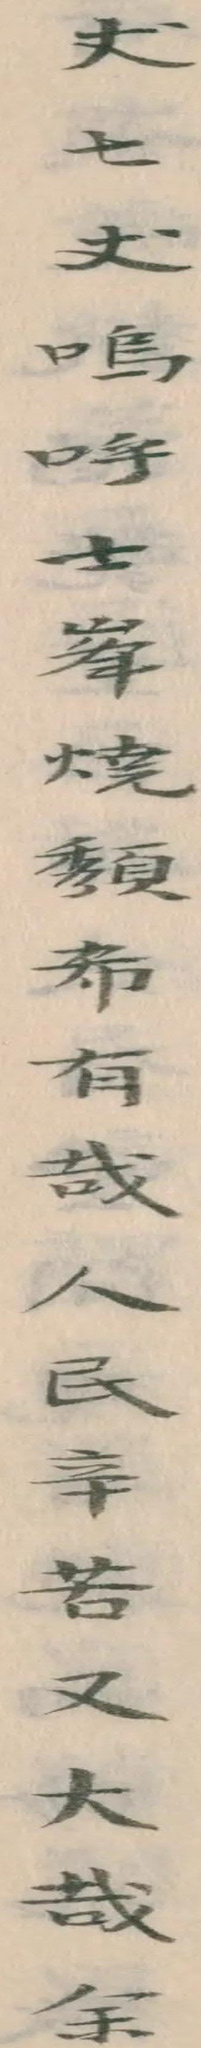丈七丈嗚呼士峯焼頺希有哉人民辛苦又大哉余
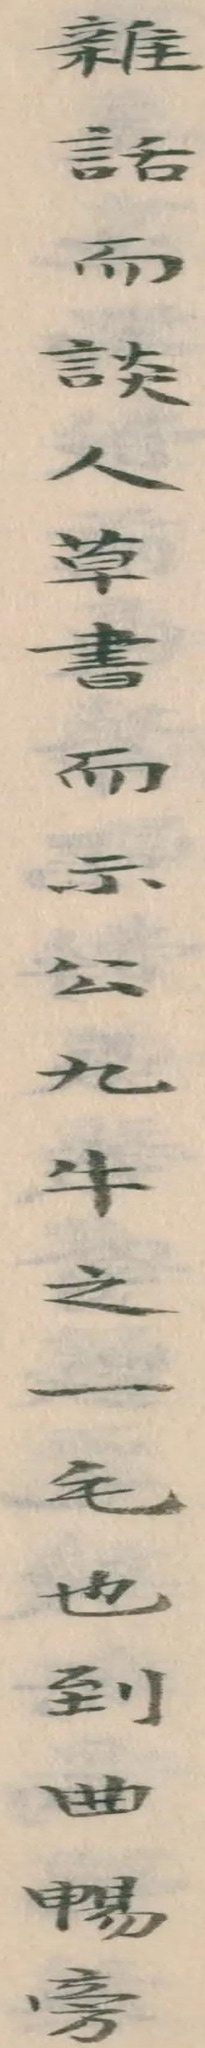雜話而談人草書而示公九牛之一毛也到曲暢旁
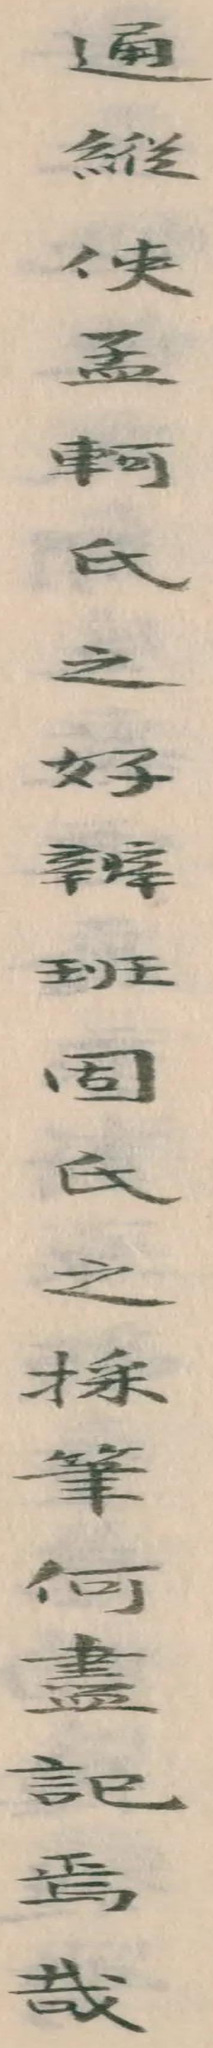通縦使孟軻氏之好辨班固氏之採筆何盡記焉哉
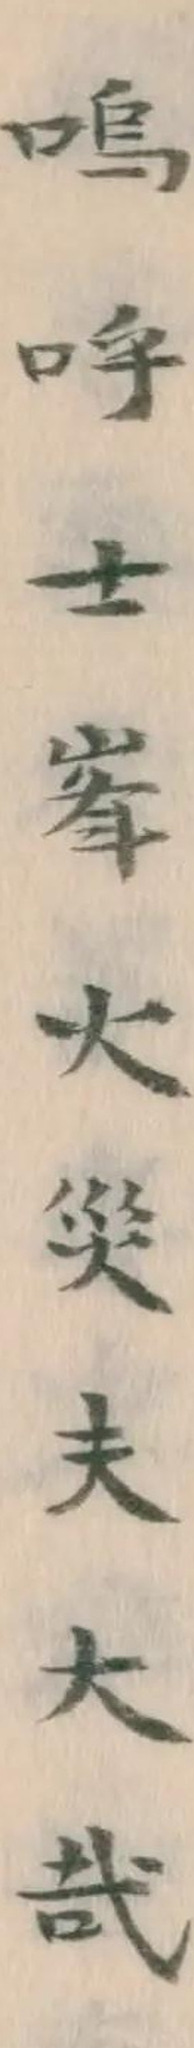嗚呼士峯火災夫大哉
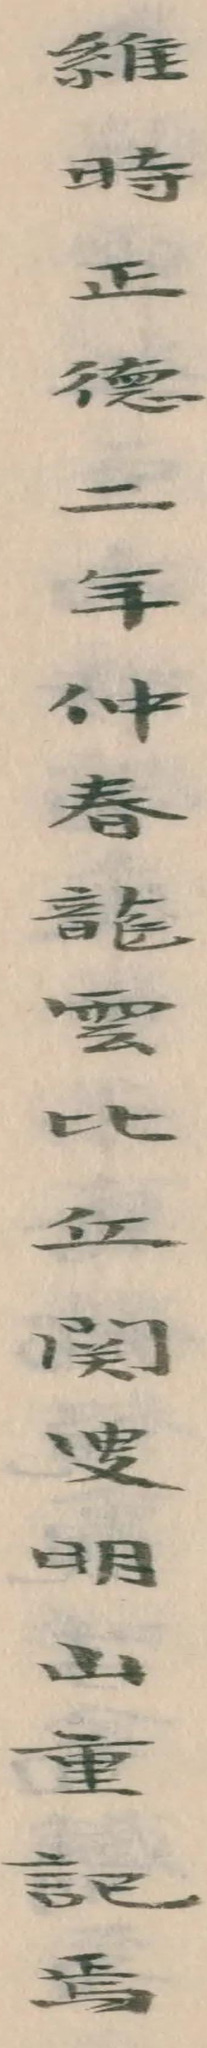維時正德二年仲春龍雲比丘関叟明山重記焉
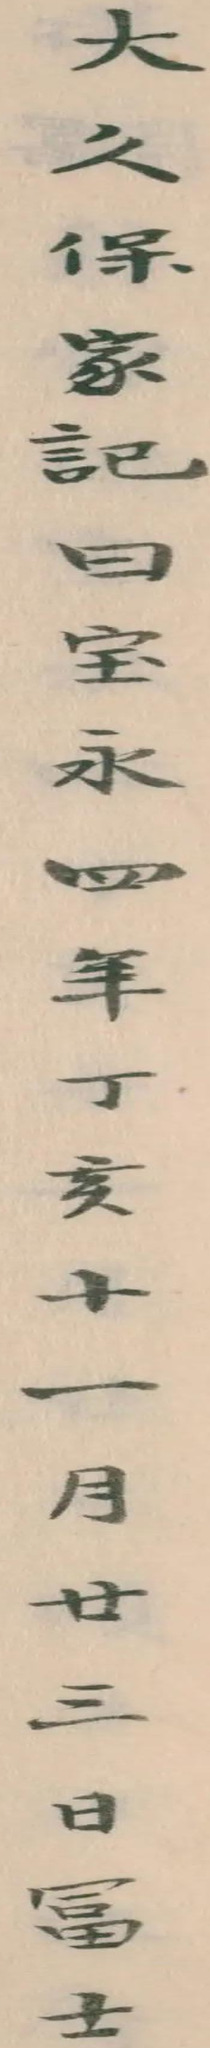大久保家記曰宝永四年丁亥十一月廿三日冨士
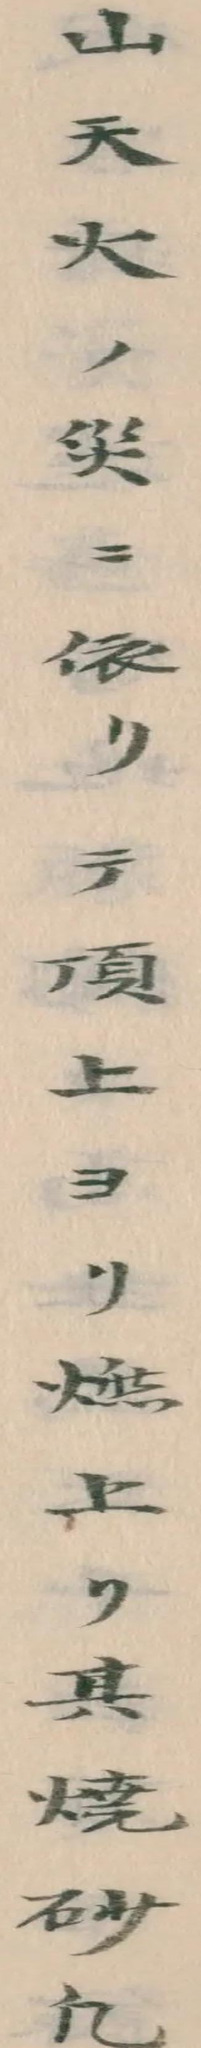山天火ノ災ニ依リテ頂上ヨリ燃上リ其焼砂凡
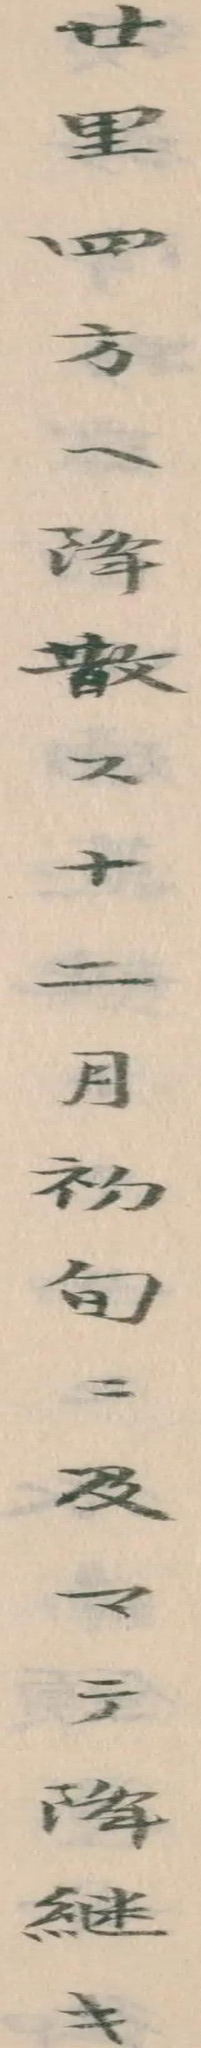廿里四方ヘ降散ス十二月初旬ニ及マテ降継キ
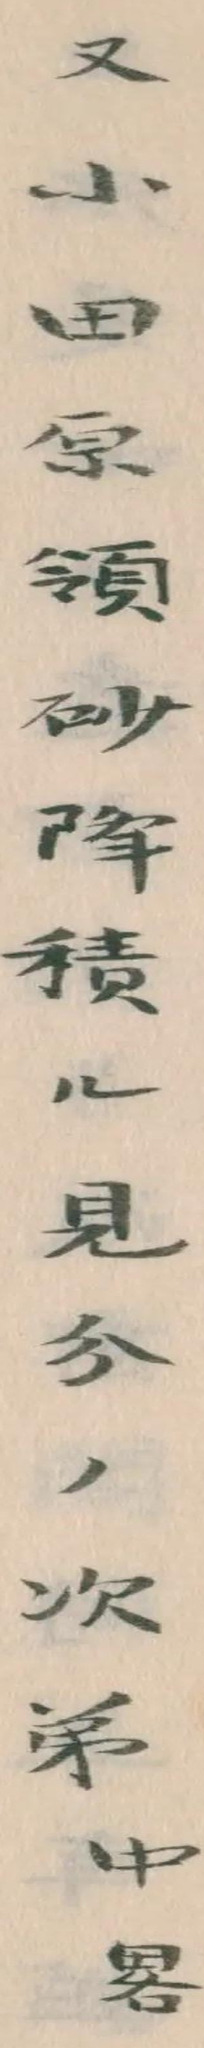又小田原領砂降積ル見分ノ次弟中畧
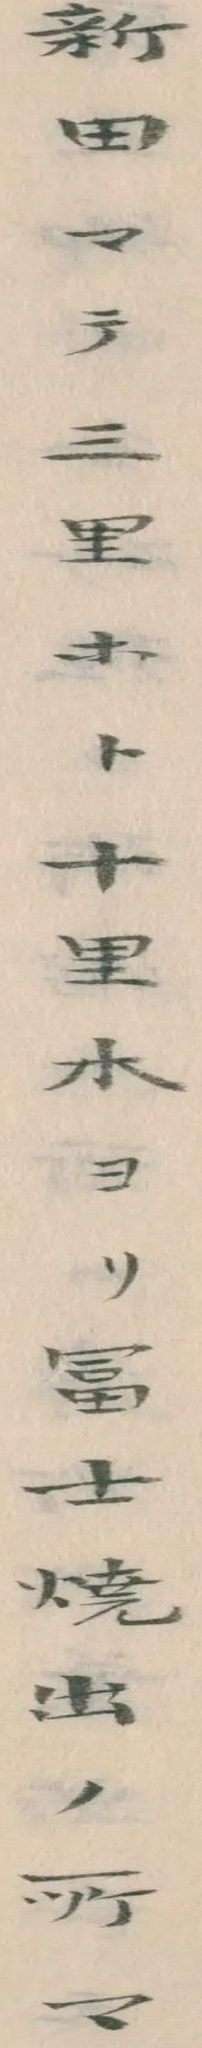新田マテ三里ホト十里木ヨリ冨士焼出ノ所マ
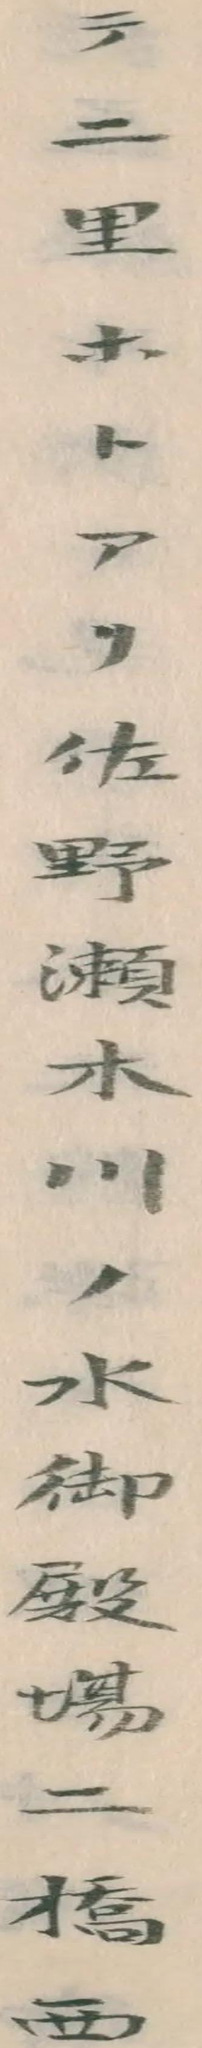テ二里ホトアリ佐野瀬木川ノ水御殿場二橋西
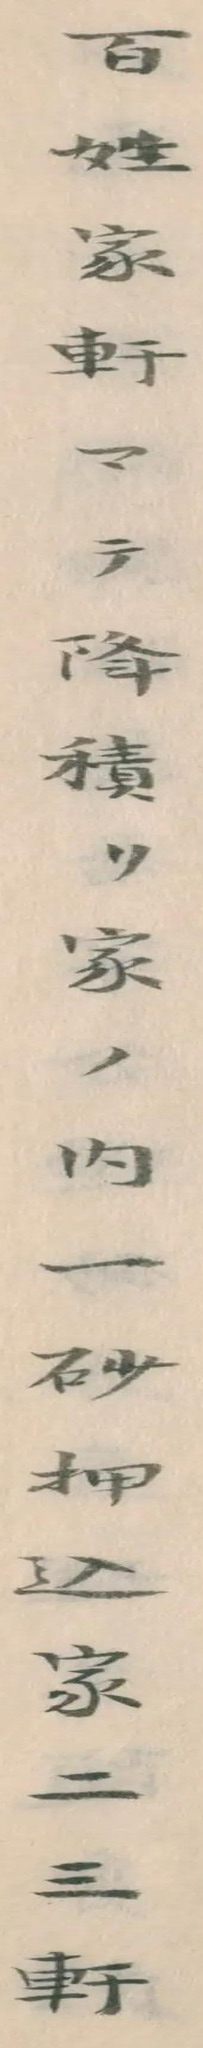百姓家軒マテ降積リ家ノ内一砂押込家二三軒
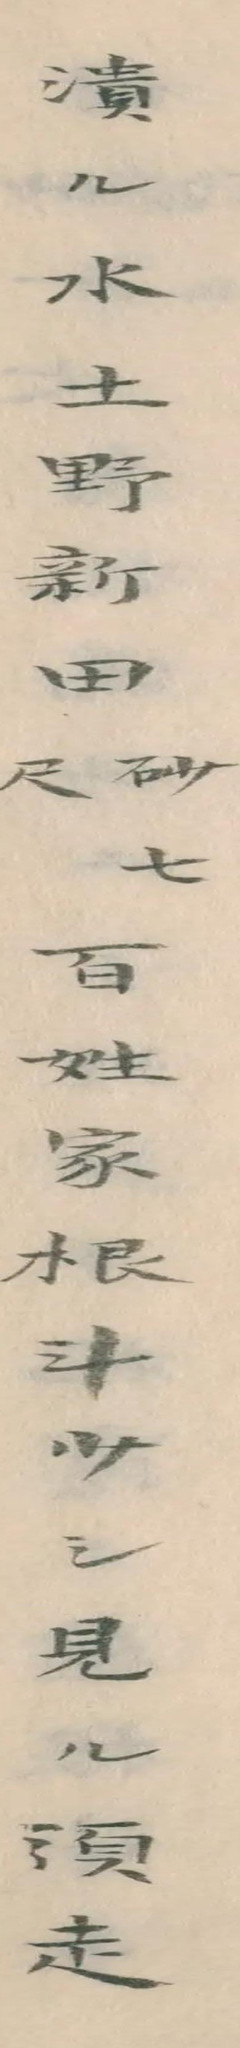潰ル水土野新田砂七尺百姓家根斗少シ見ル須走

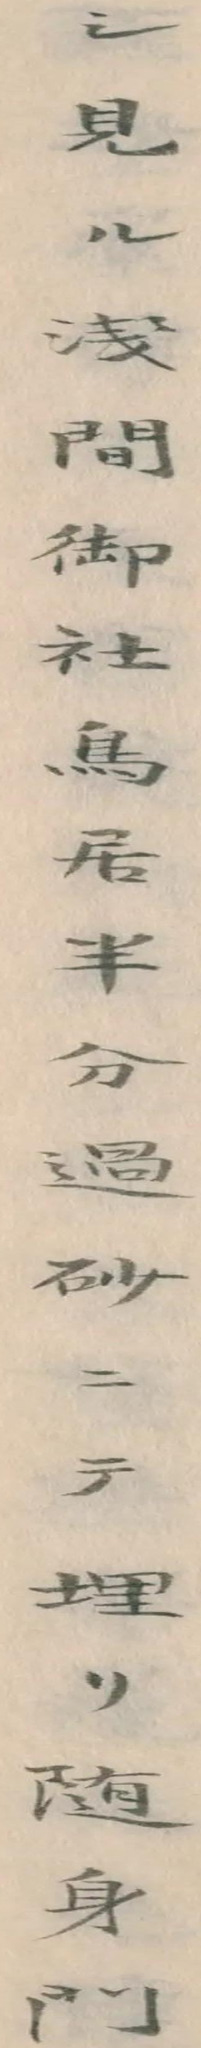シ見ル浅間御社鳥居半分過砂ニテ埋リ随身門
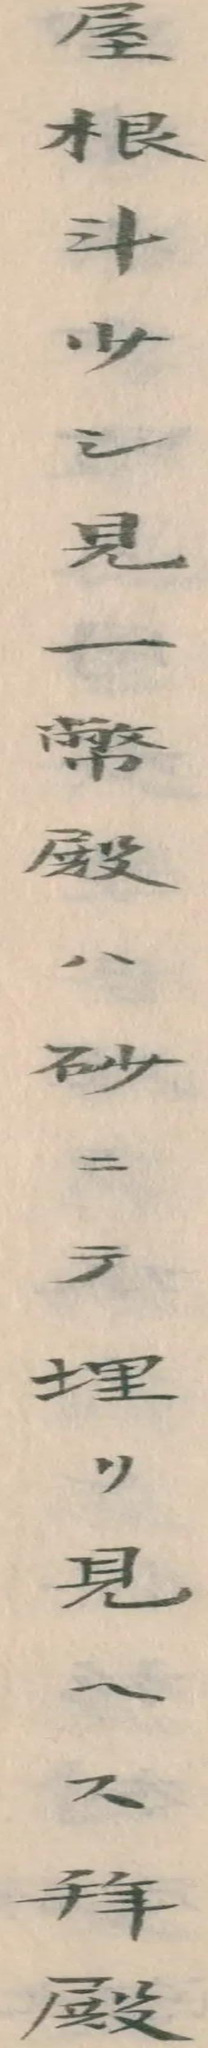屋根斗少シ見一幣殿ハ砂ニテ埋リ見ヘス拜殿
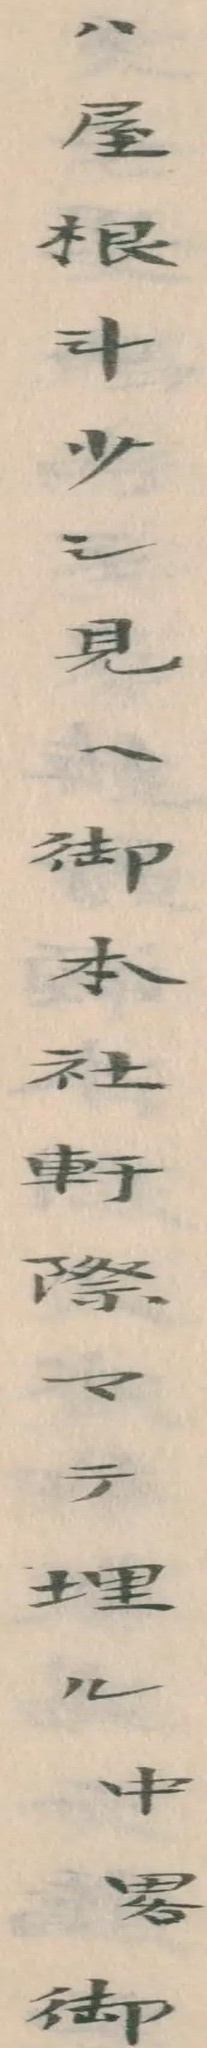ハ屋根斗少シ見ヘ御本社軒際マテ埋ル中畧御
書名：地災撮要. 巻11-12(地震之部)
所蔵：国立国会図書館 National Diet Library, JAPAN
